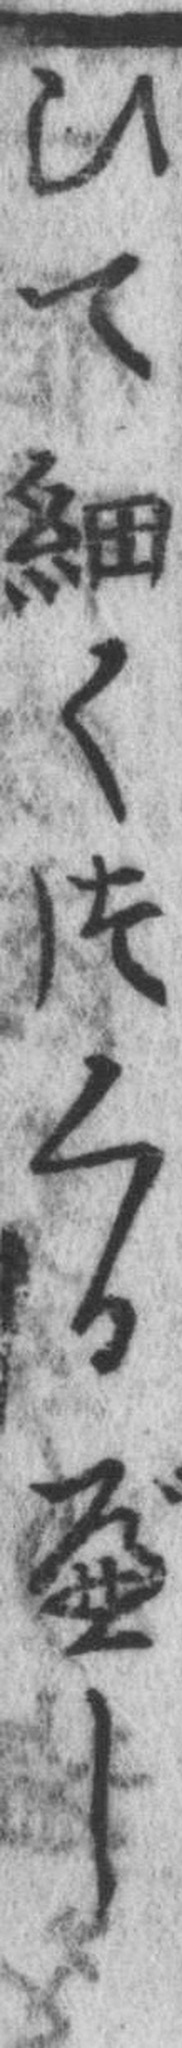ひて。細くつくるべし
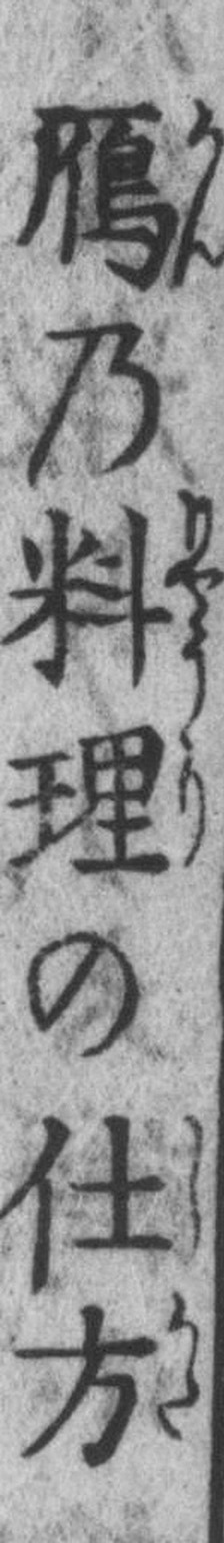雁の料理の仕方
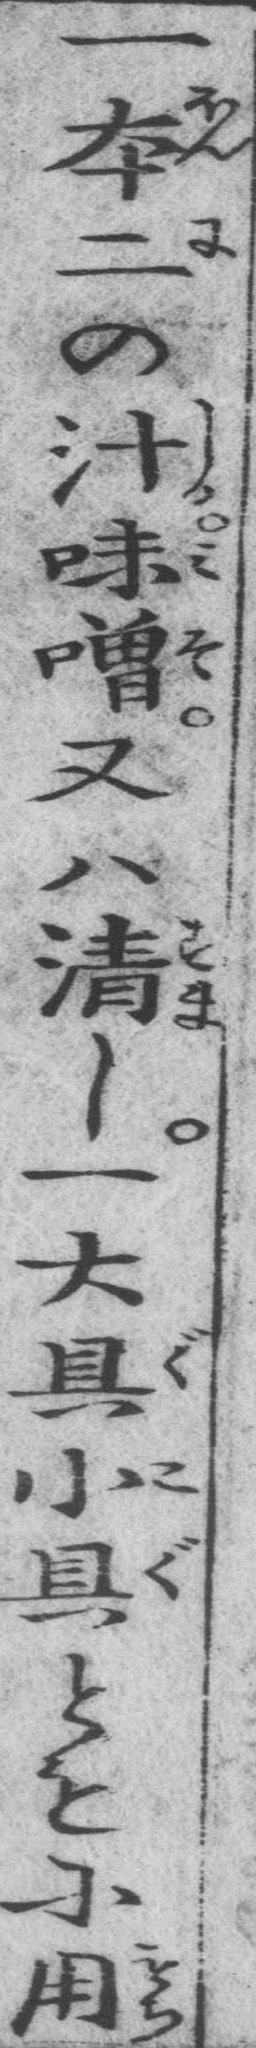一本二の汁。味噌。又は清し。一大具小具ともに用
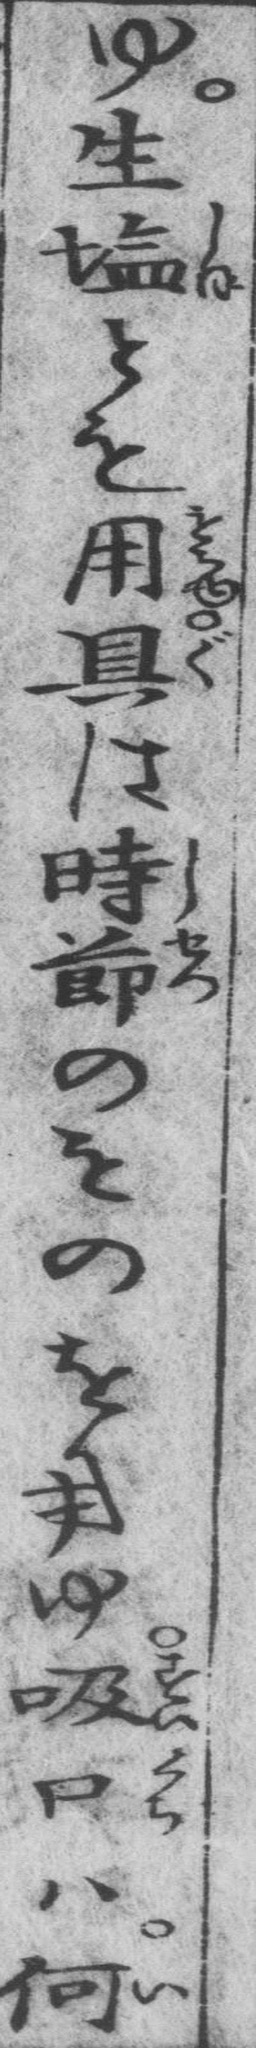ゆ。生塩とも用。具は時節のものを用ゆ。吸口は。何
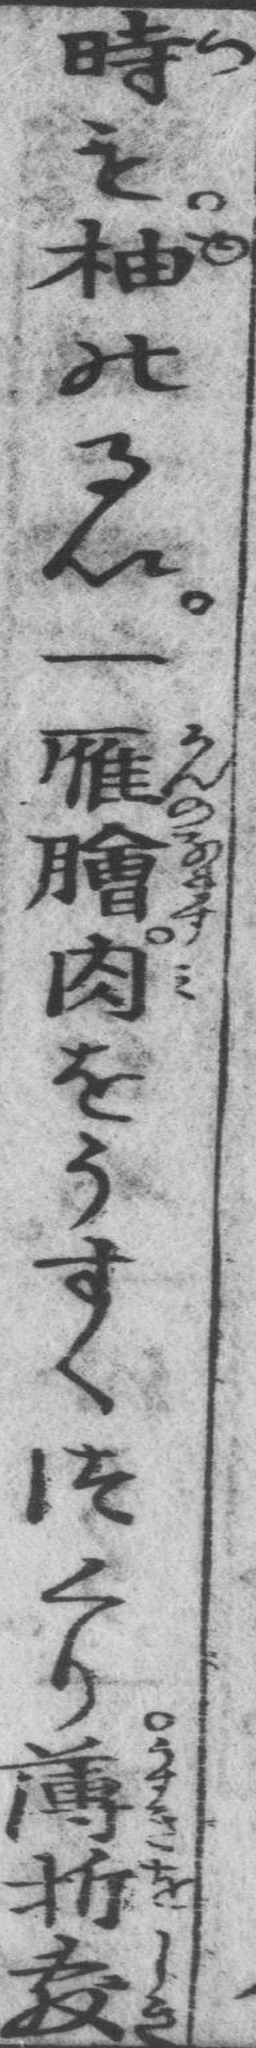時も。柚のるい。一雁鱠。肉をうすくつくり。薄折敷
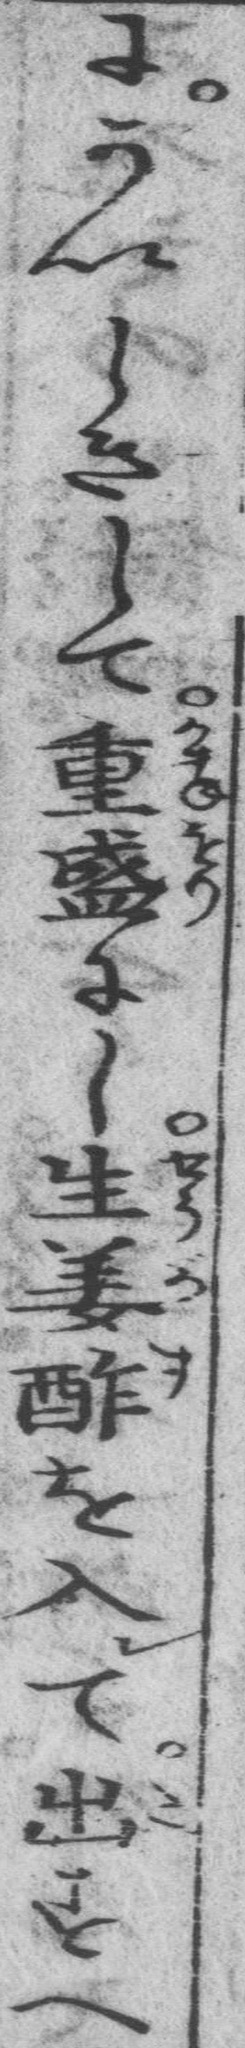に。かいしきして。重盛にし。生姜酢を入れて。出すへ
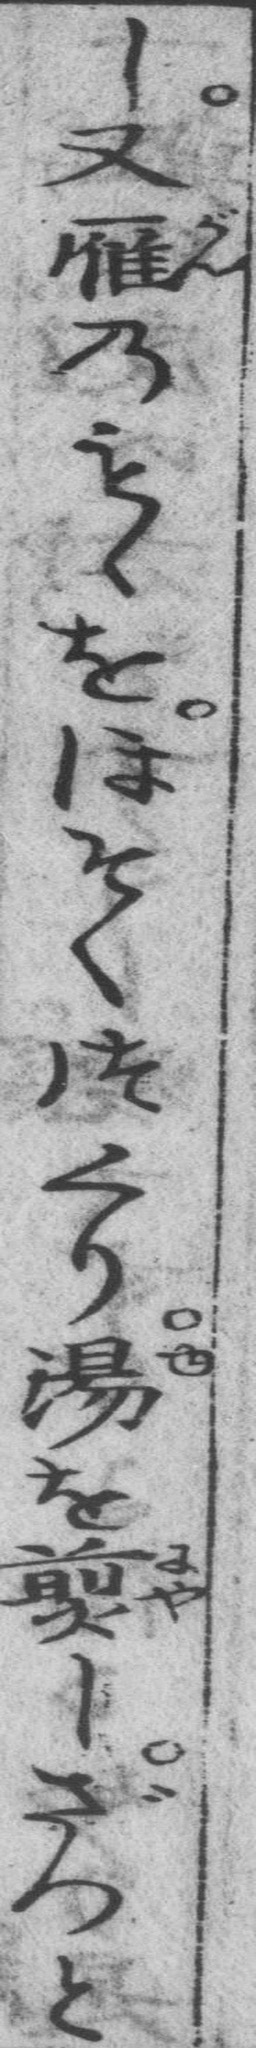し。又雁のもゝを。ほそくつくり。湯を煎し。ざつと
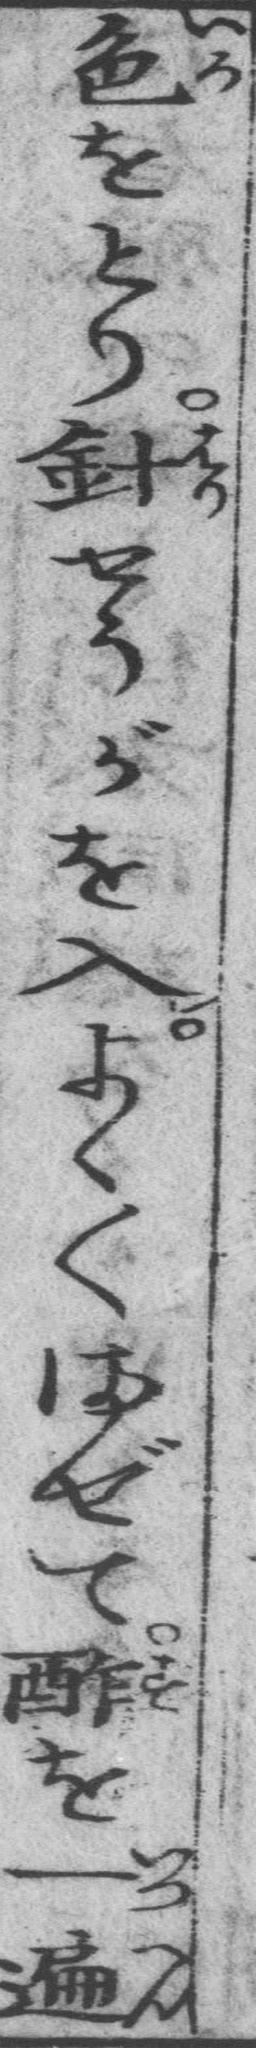色をとり。針せうがを入れ。よく〳〵まぜて。酢を一遍
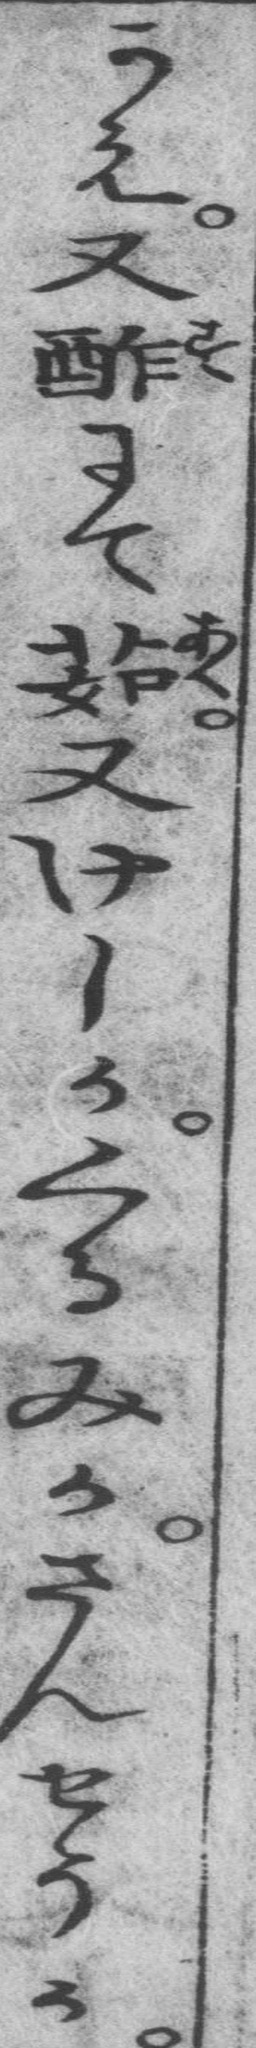かえ。又酢にて茹。又けしか。くすみか。さんせうか。
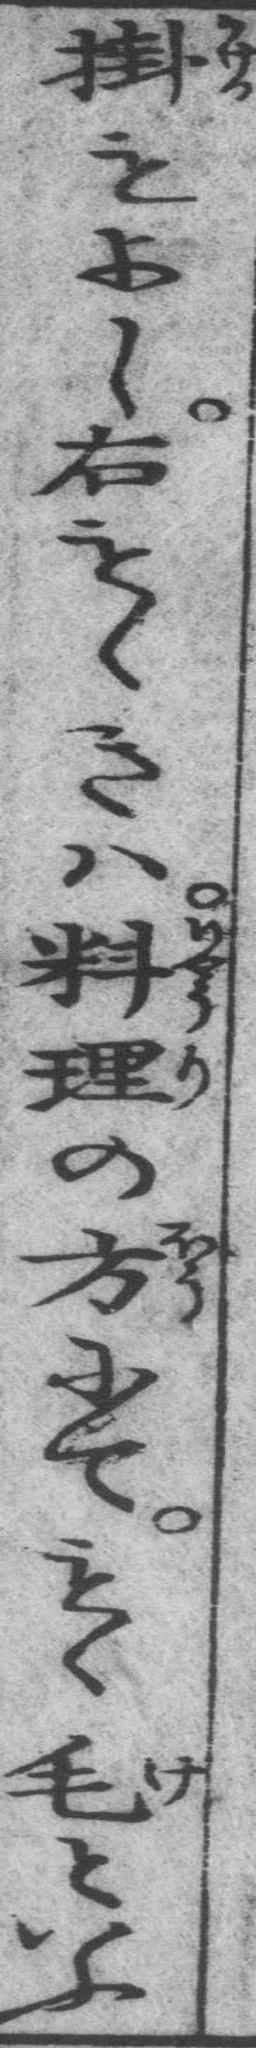掛もよし。右もゝきは。料理の方にて。もゝ毛といふ

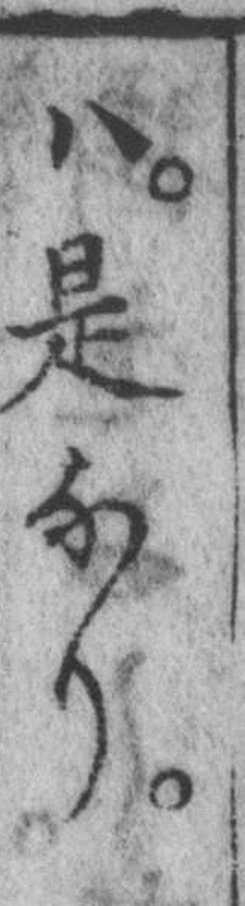は。是なり。
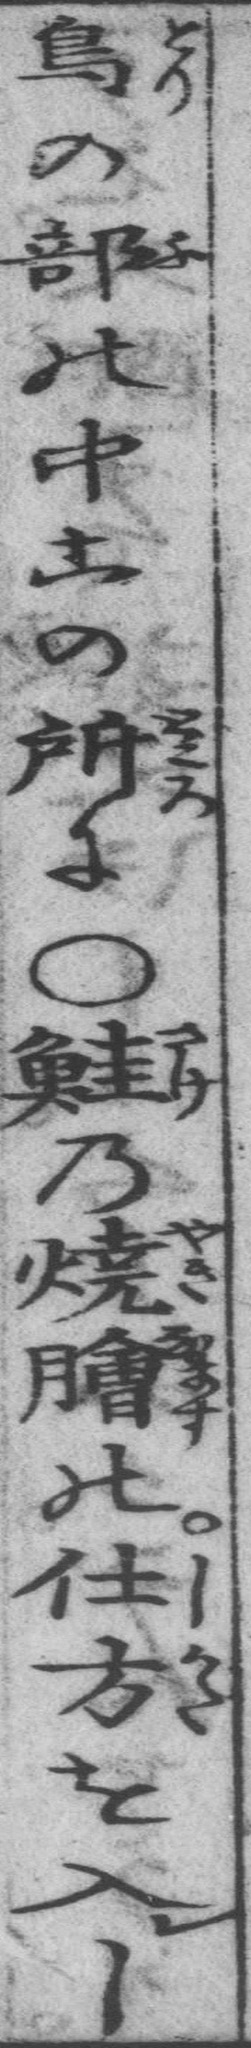鳥の部の中この所に○鮭の焼鱠の。仕方を入れし
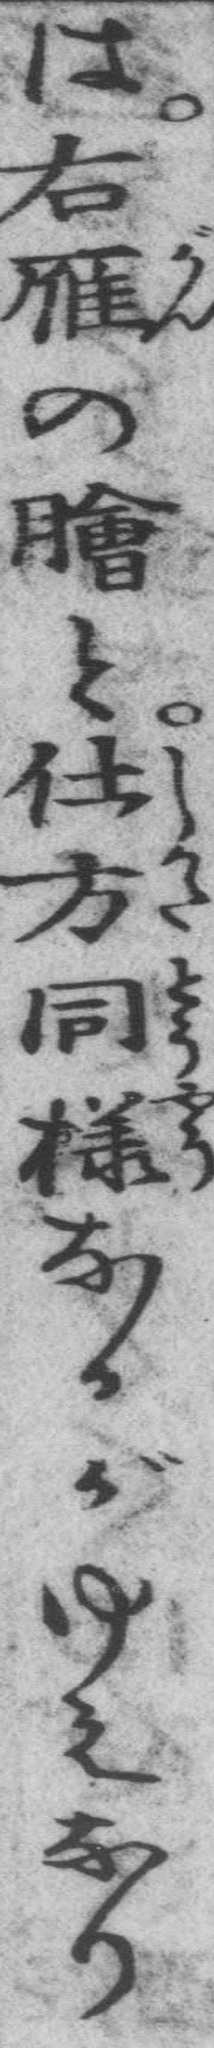は。右雁の鱠と。仕方同様なるがゆえなり
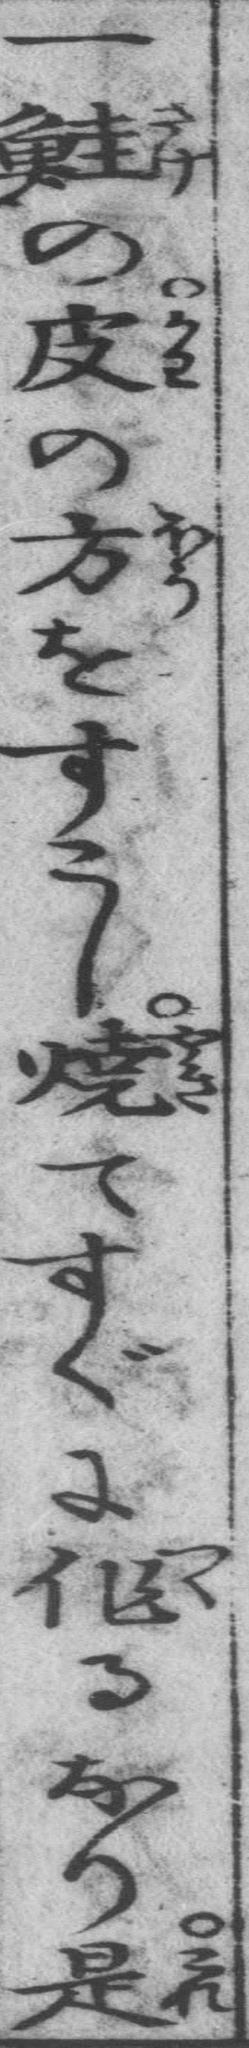一鮭の。皮の方をすこし。焼てすぐに作るなり。是
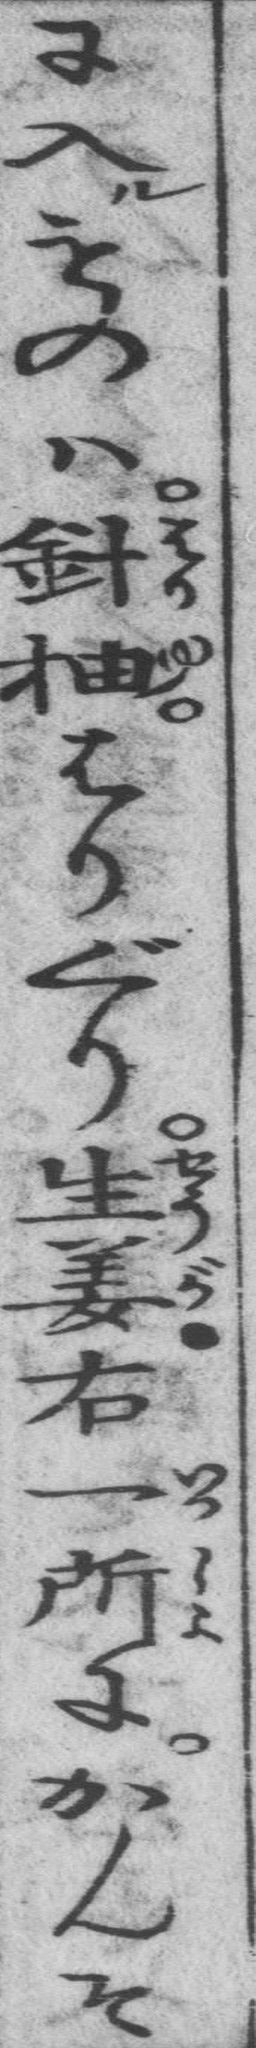に入るものは。針柚。はりぐり。生姜。右一所に。かんそ
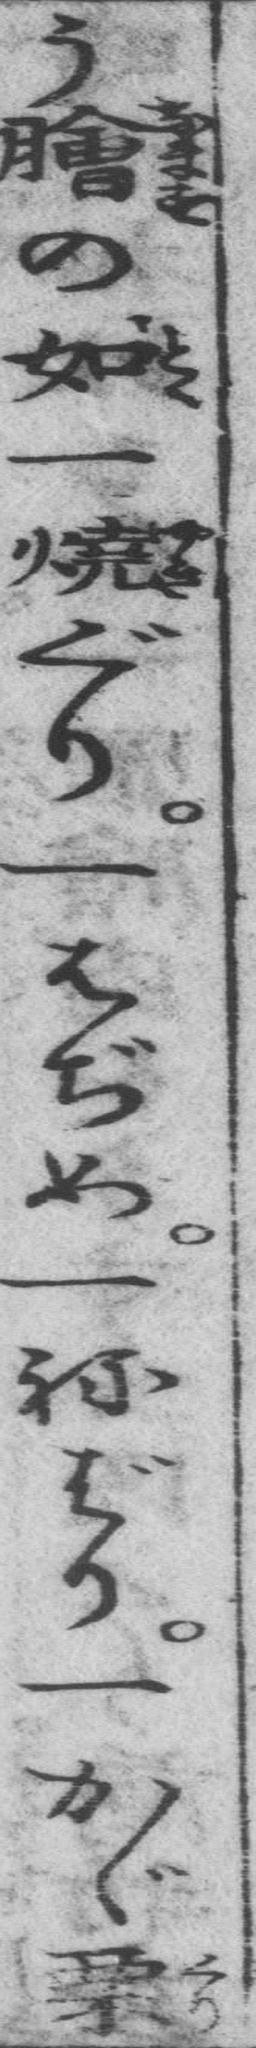う鱠の如一焼ぐり。一はぢめ。一ねばり。一かじ栗
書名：萬寳料理秘密箱
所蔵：大阪府立大学学術情報センター 国文学研究資料館
